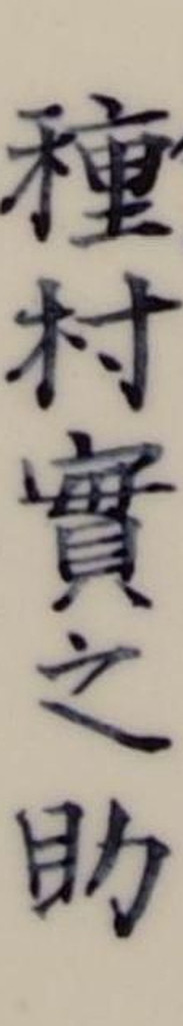種村寶之助
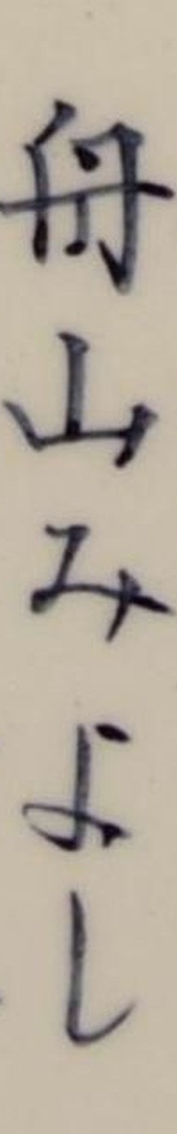舟山みよし
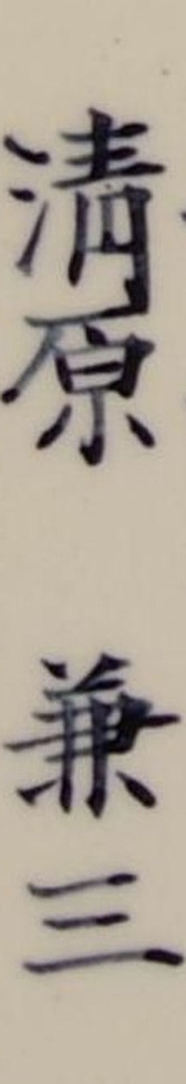清原兼三
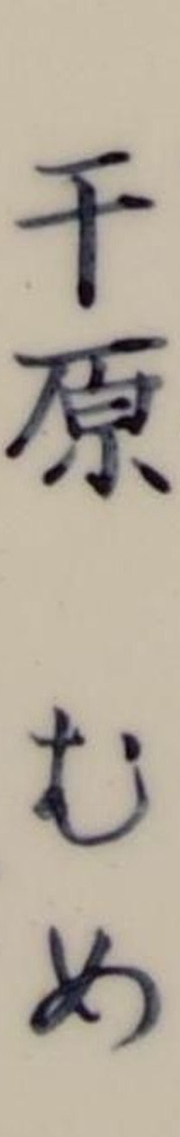干原むめ
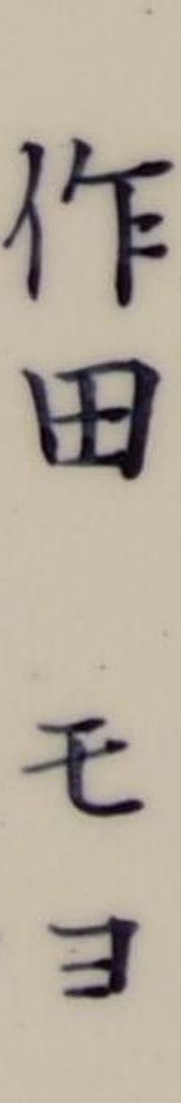作田モヨ
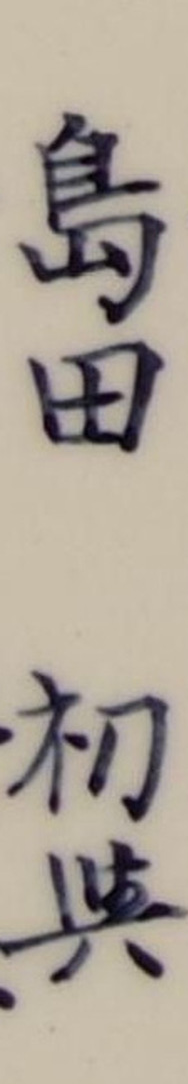島田初興
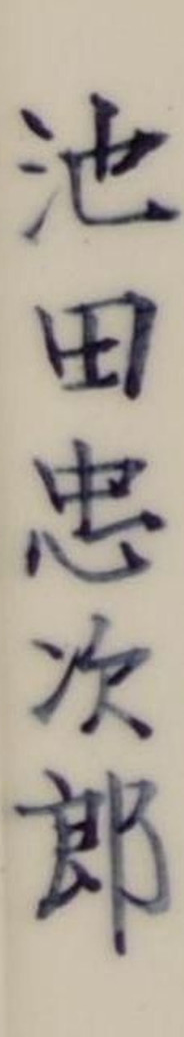池田忠次郎

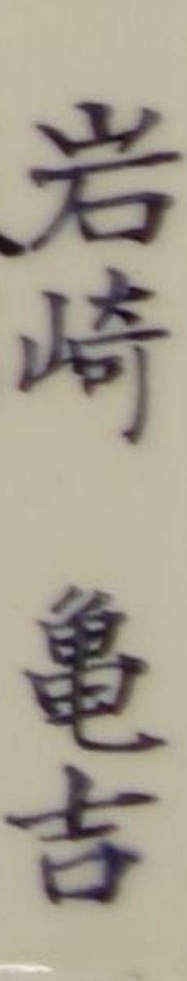岩崎亀吉
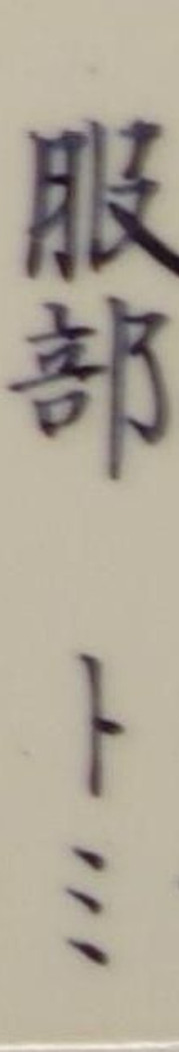服部トミ
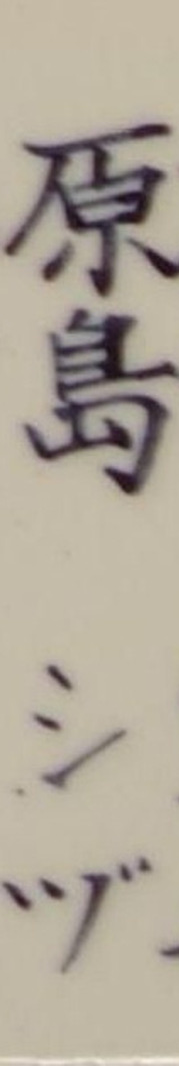原島シヅ
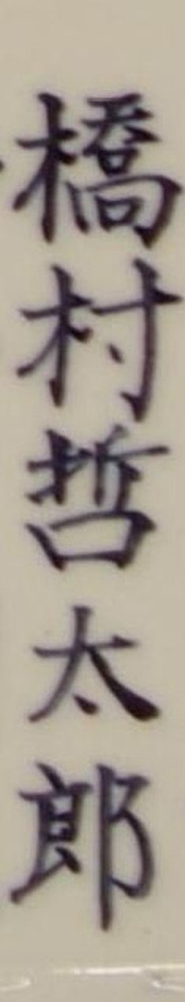橋村哲太郎
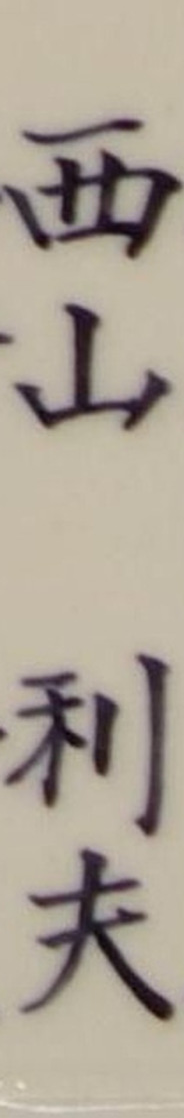西山利夫
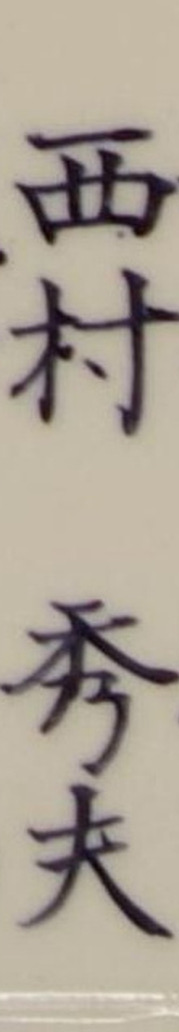西村秀夫
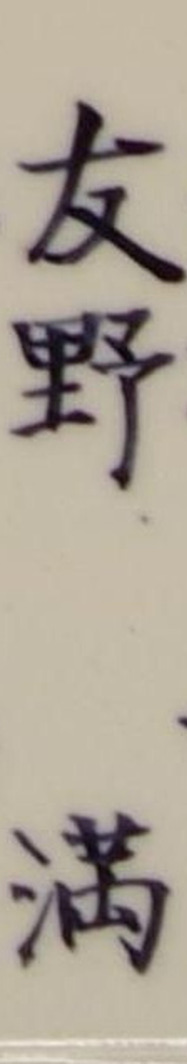友野満
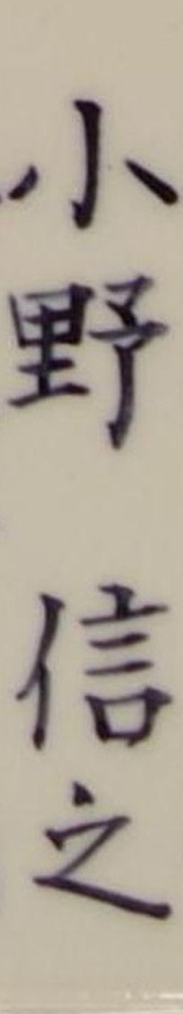小野信之
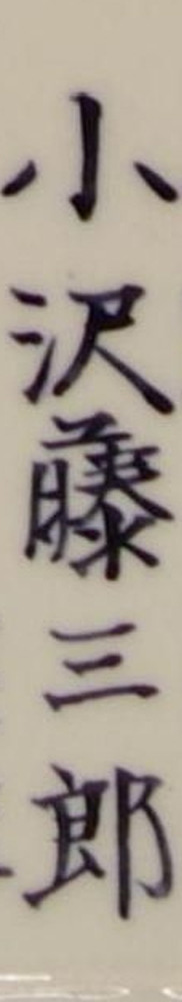小沢藤三郎
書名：M~S
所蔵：高野山金剛峯寺
